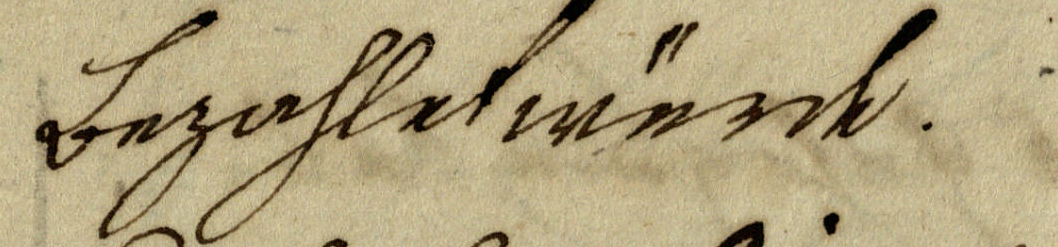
bezahlet würde.
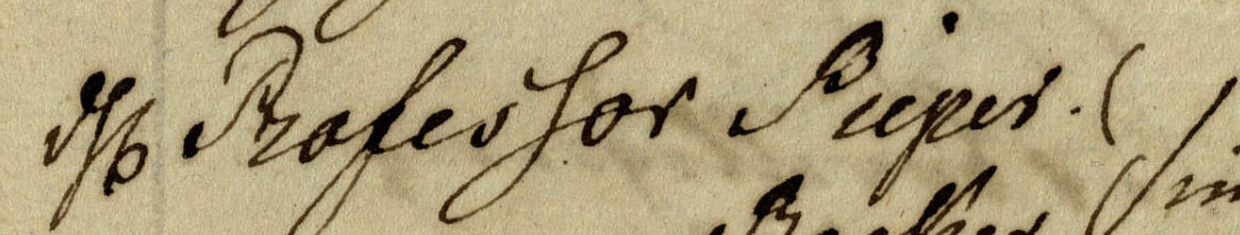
dh. Professor Pieper.
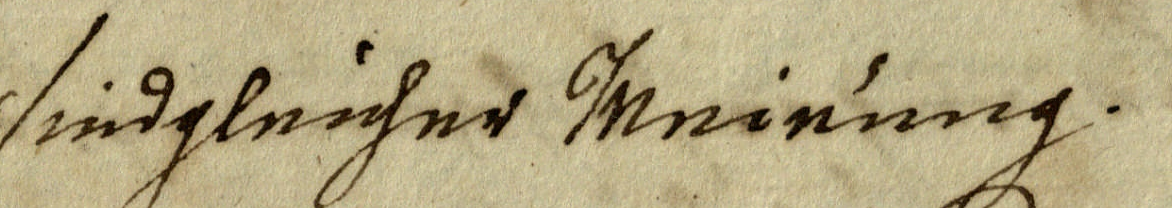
sind gleicher Meinung.
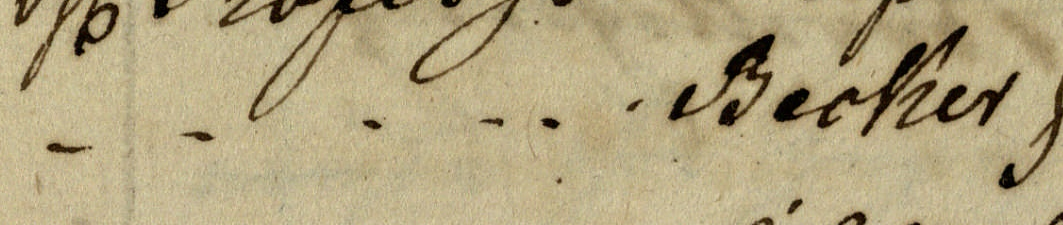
Becker
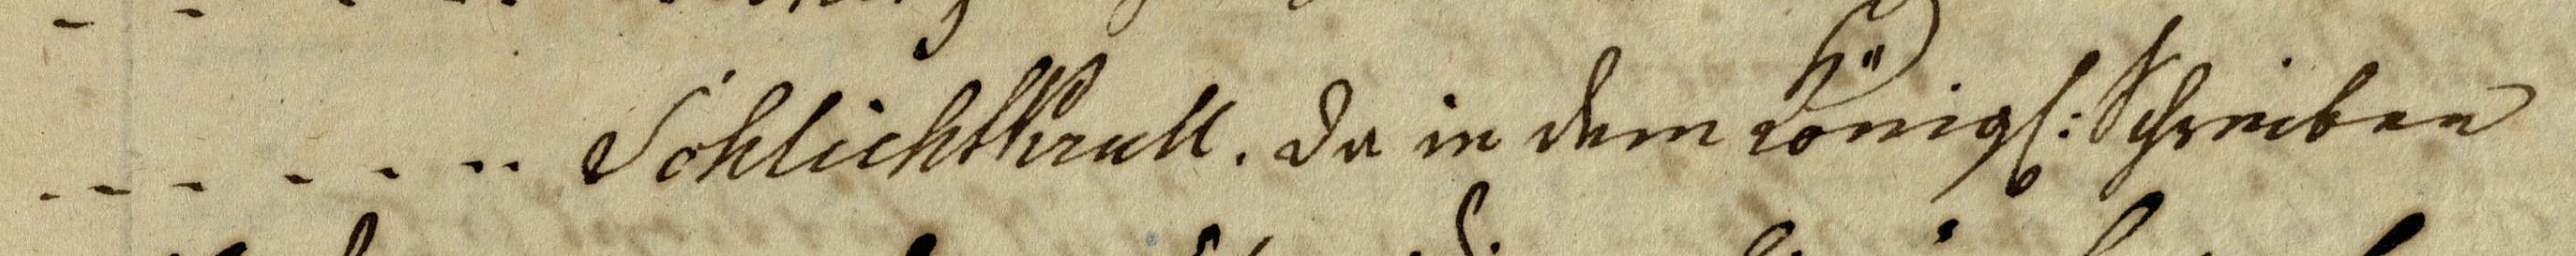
Schlichtkrull. Da in dem Königl. Schreiben
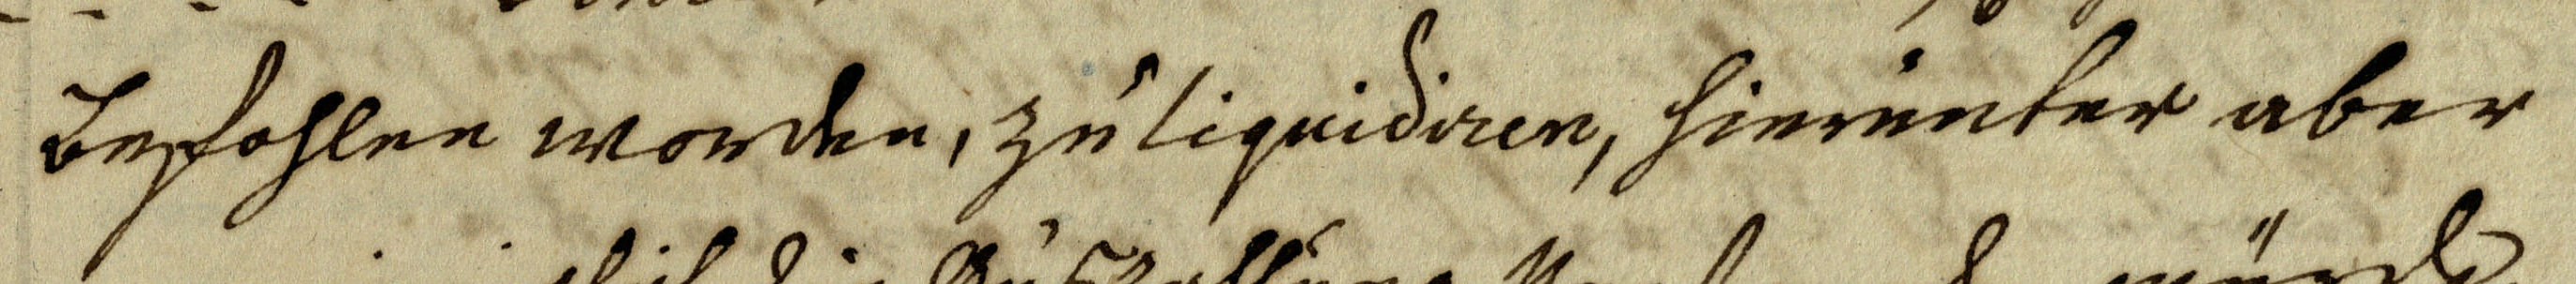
befohlen worden, zu liquidiren, hirunter aber
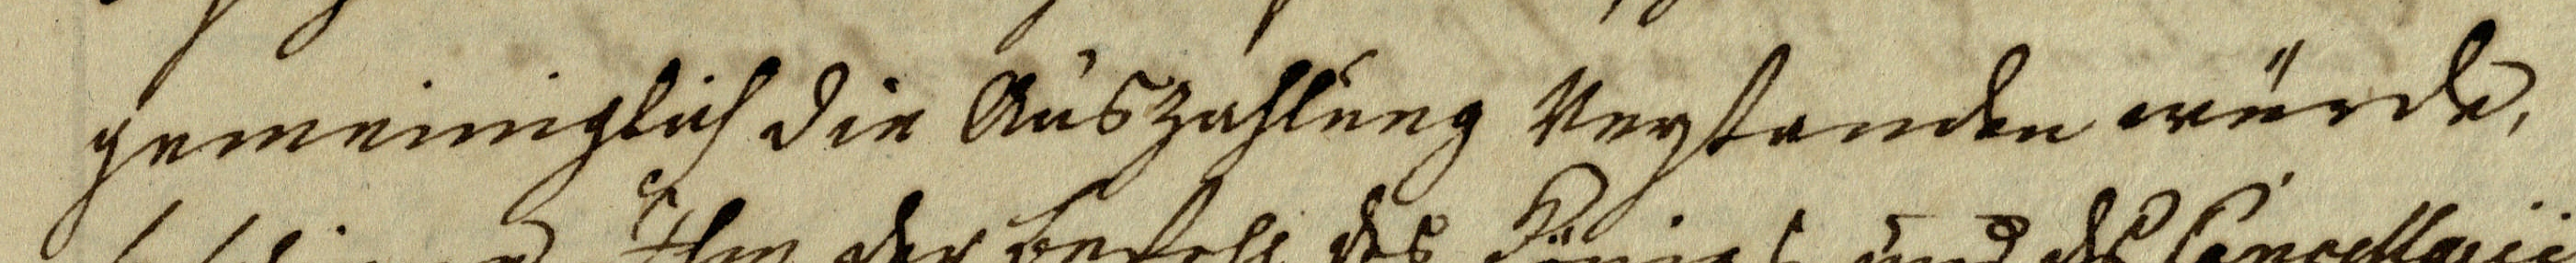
gemeiniglich die Auszahlung verstanden würde,
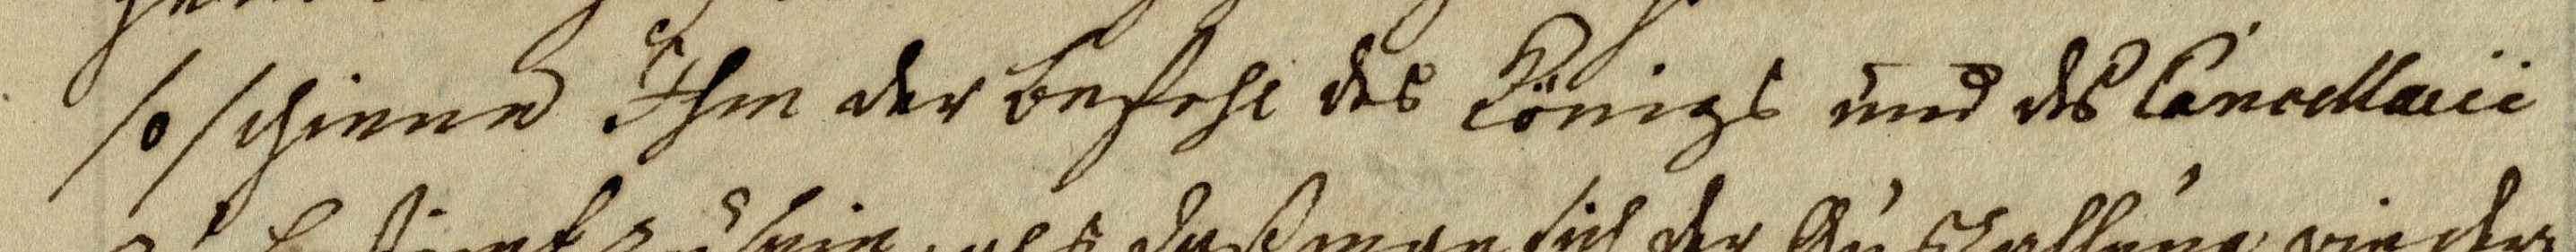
so schiene Ihm der Befehl des Königs und des Cancellarii
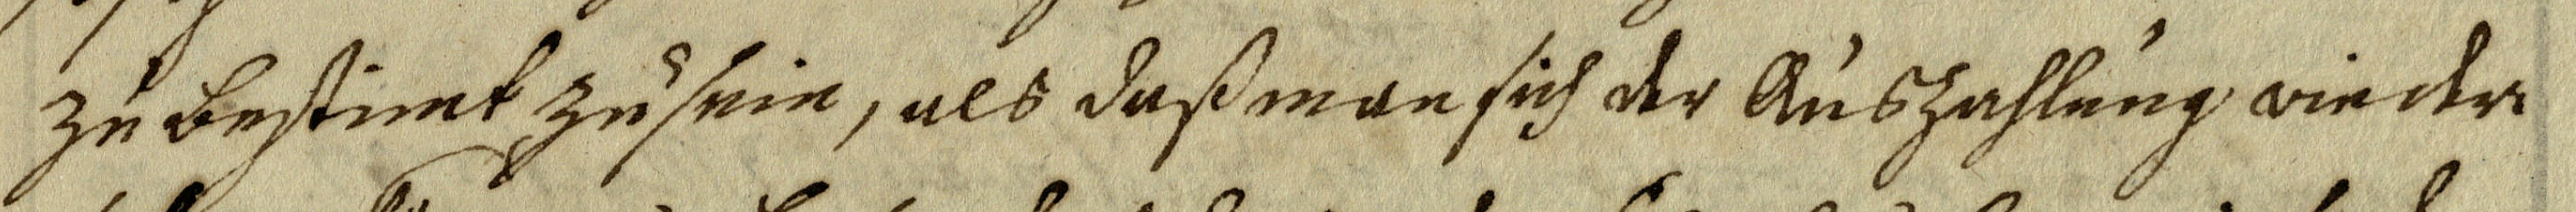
zu bestimt zu sein, als daß man sich der Auszahlung wieder¬
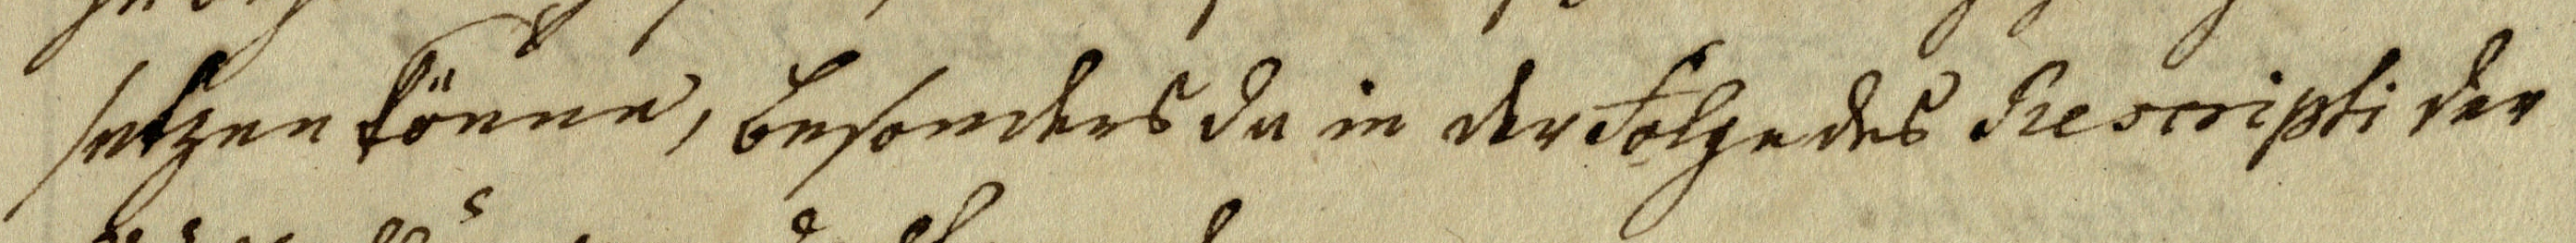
setzen könne, besonders da in der Folge des Rescripti der
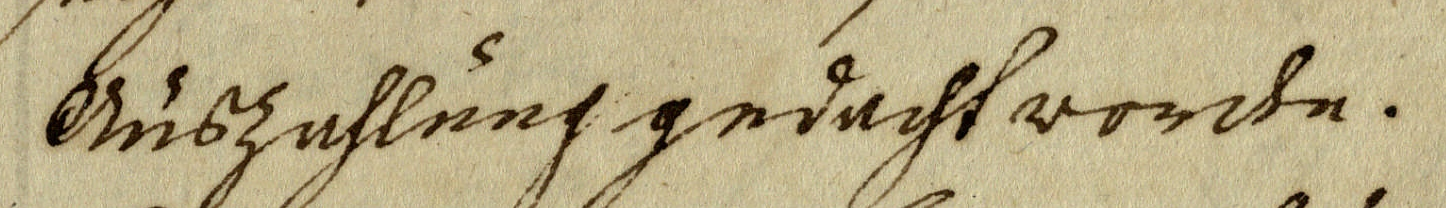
Auszahlung gedacht worden.
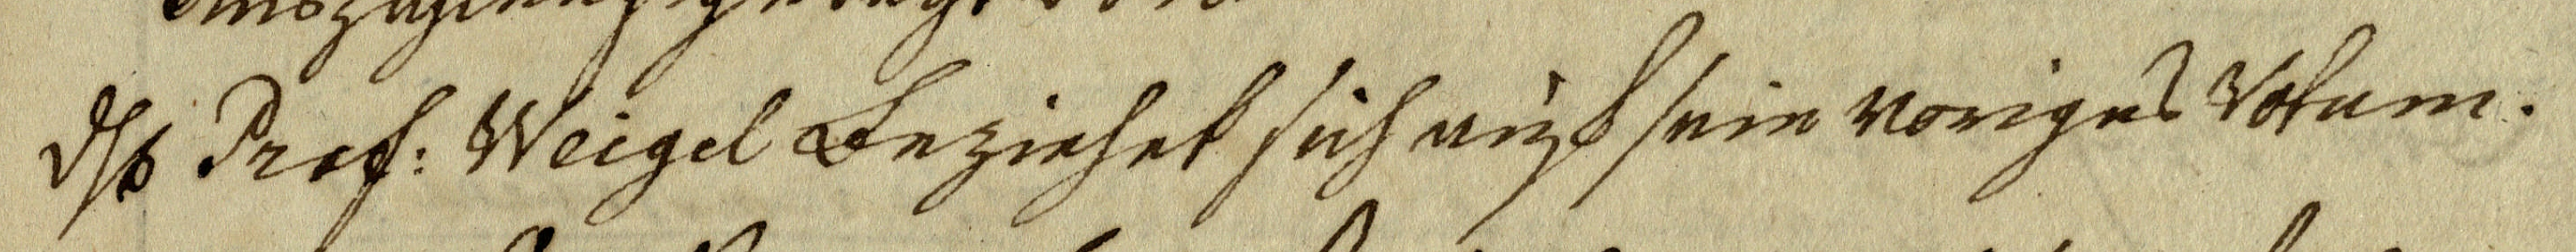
dh. Prof. Weigel beziehet sich auf sein voriges Votum.
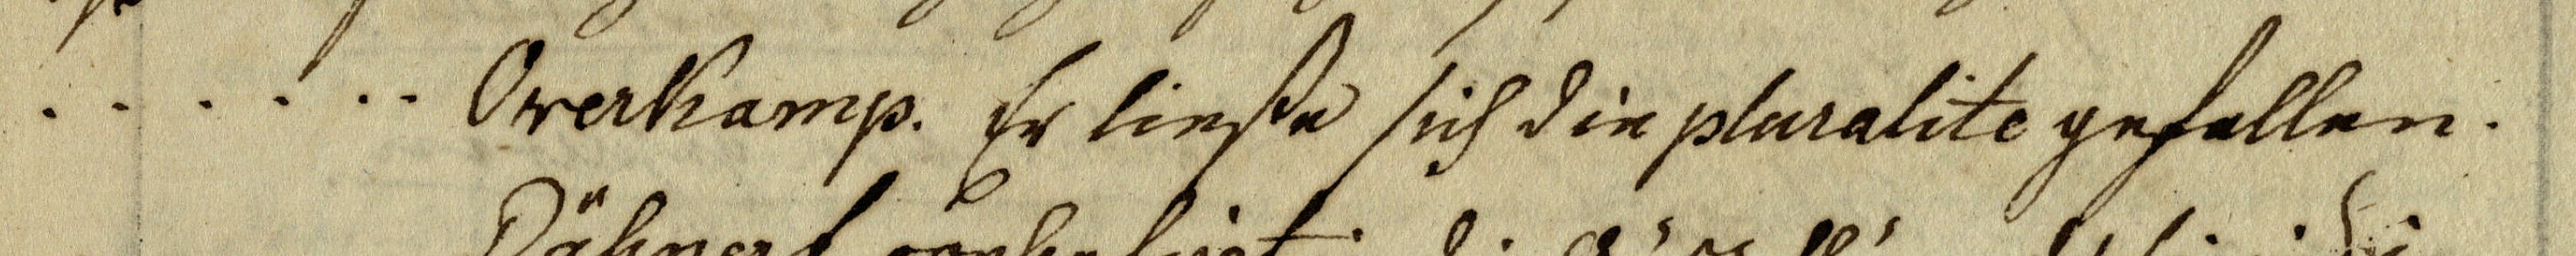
Overkamp. Er ließe sich die pluralite gefallen.
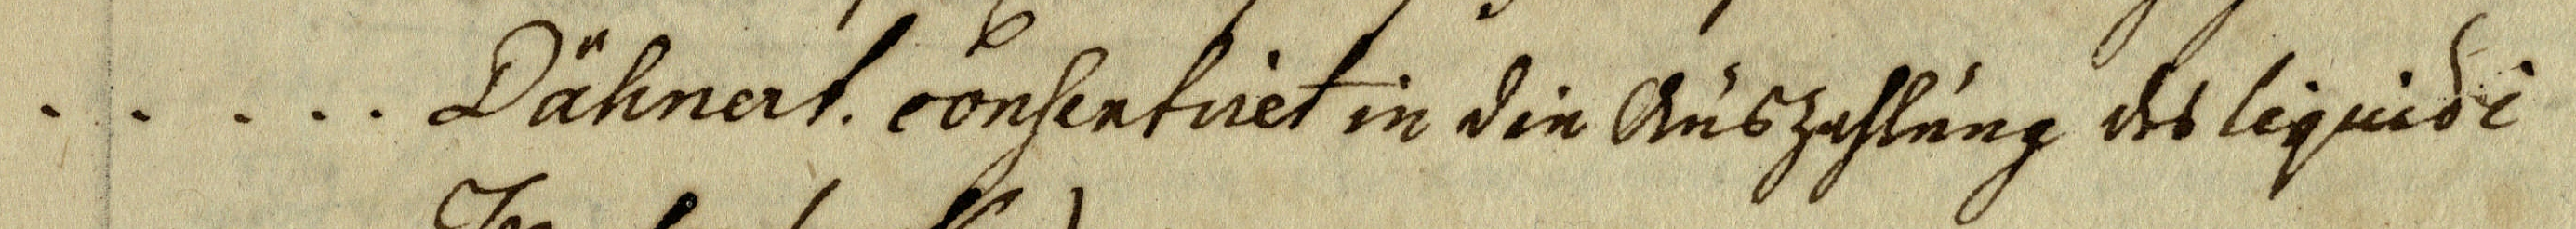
Dähnert consentiret in die Auszahlung des liquidi.
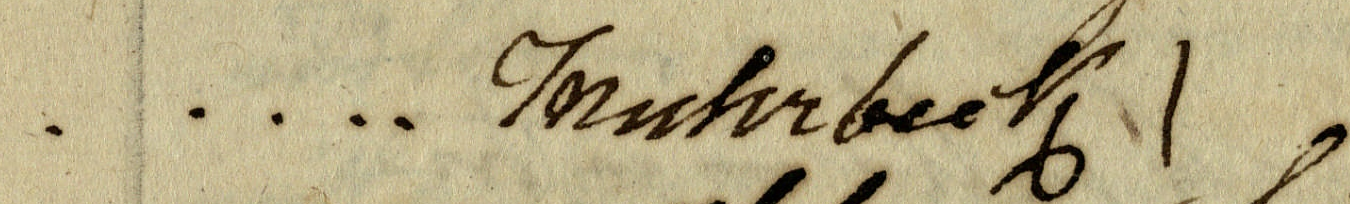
Muhrbeck
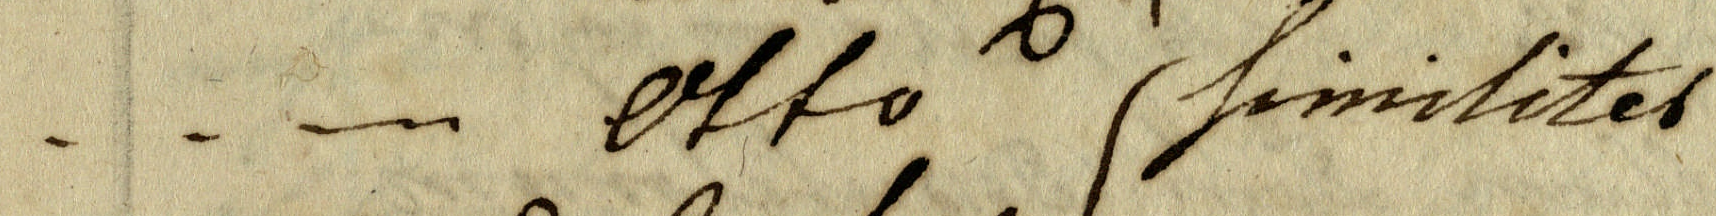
Otto
